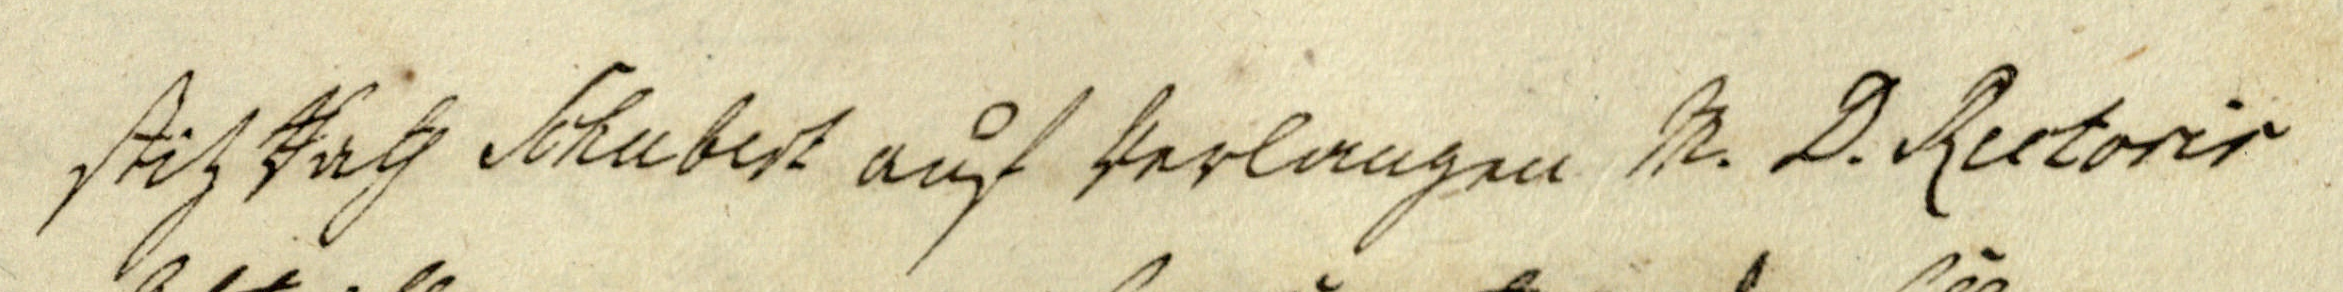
stiz Rath Schubert auf Verlangen M. D. Rectoris
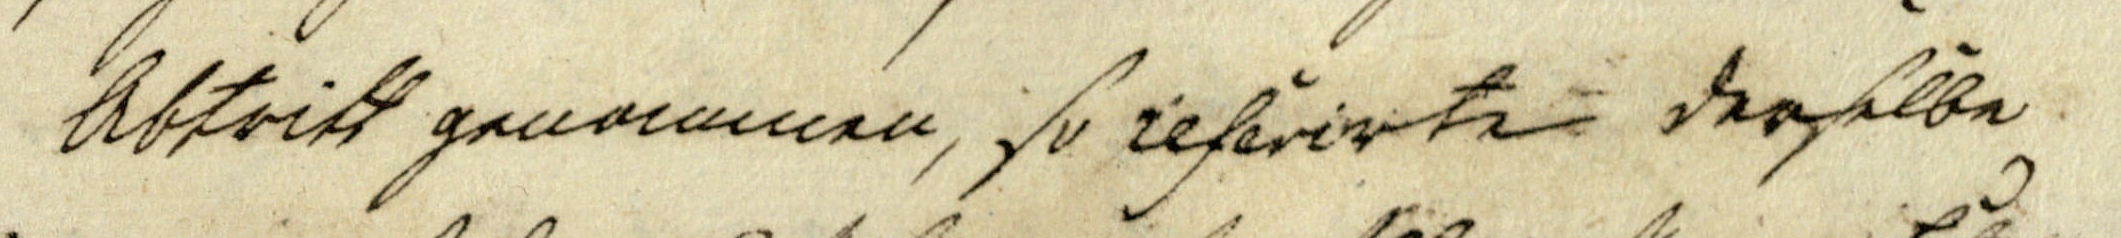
Abtritt genommen, so referirte derselbe
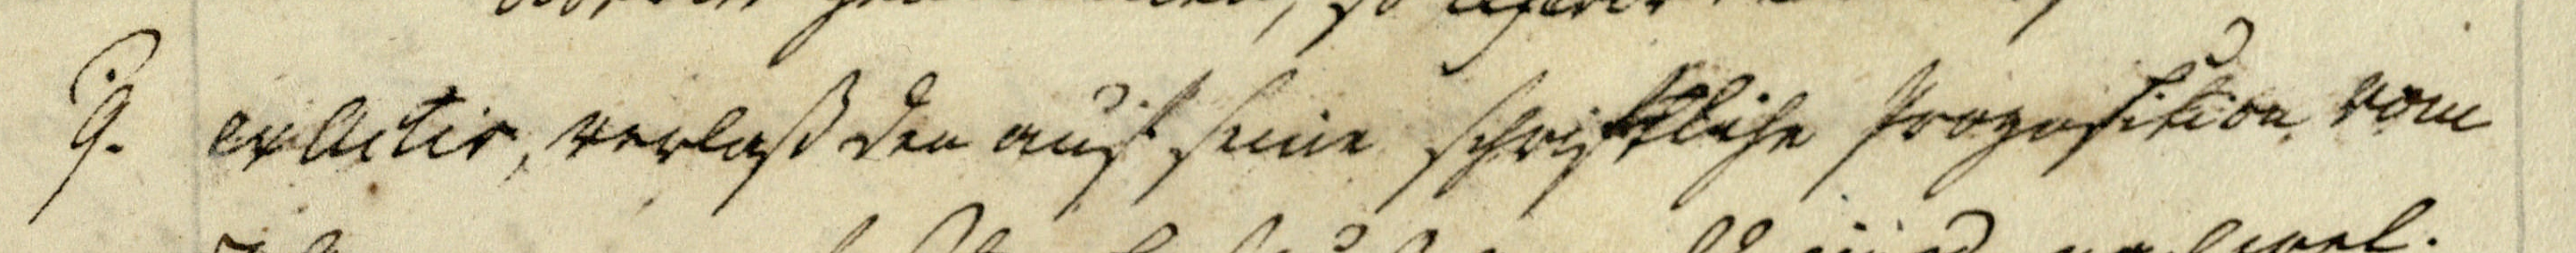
9. ex Actis, verlaß den auf seine schriftliche Proposition vom
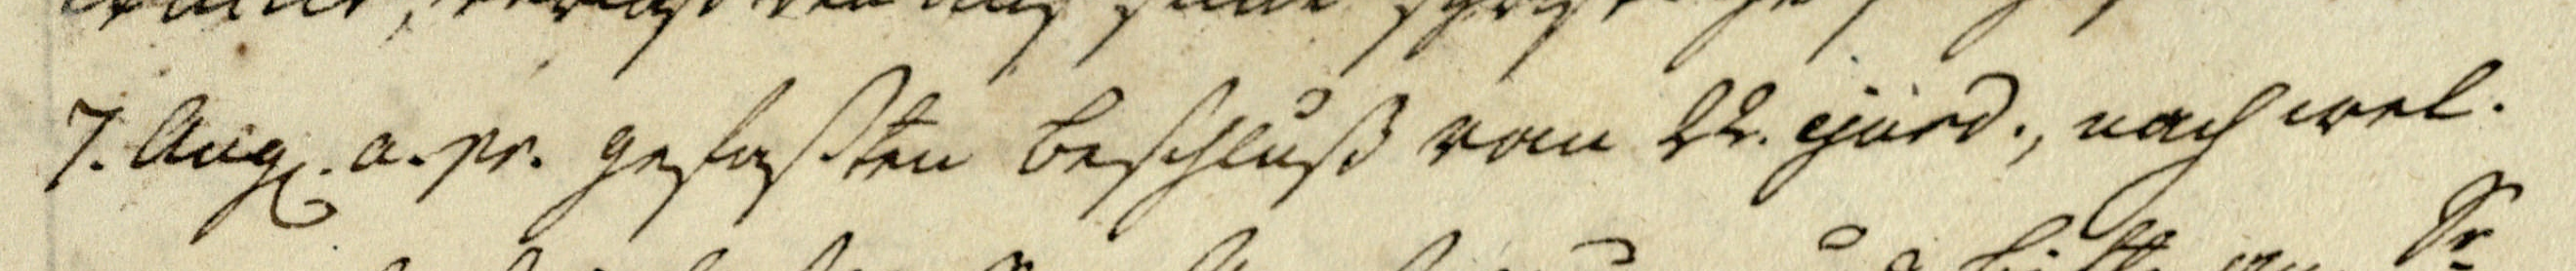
7. Aug. a. pr. gefaßten Beschluß vom 22 ejusd., nach wel¬
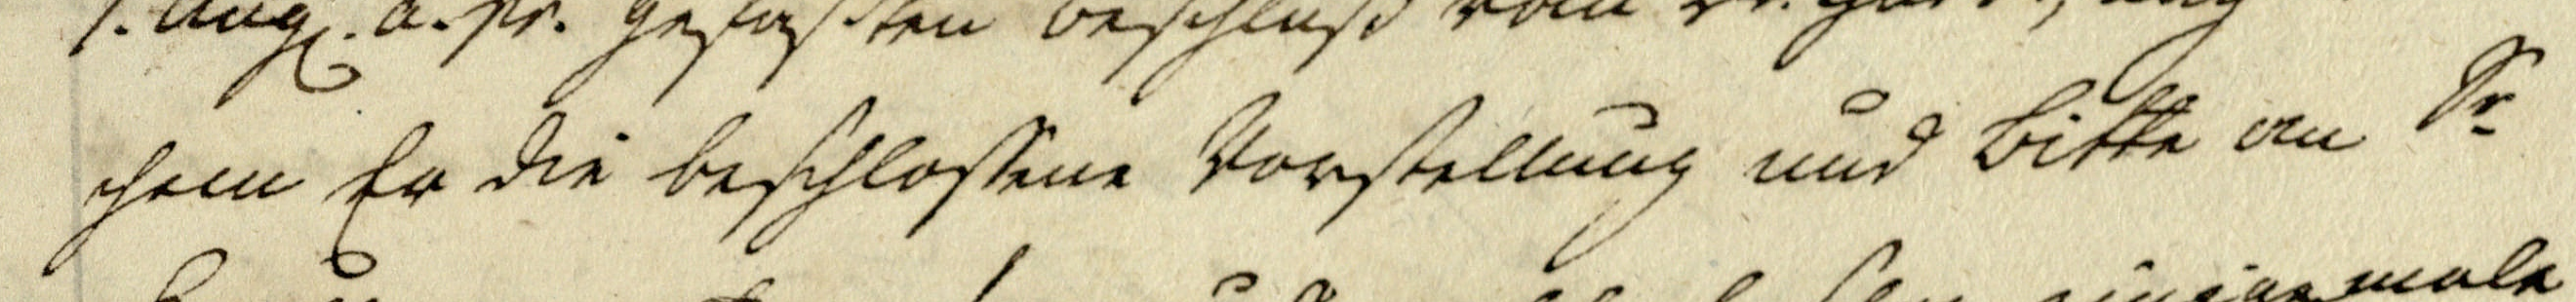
chem Er die beschlossene Vorstellung und Bitte an Sr
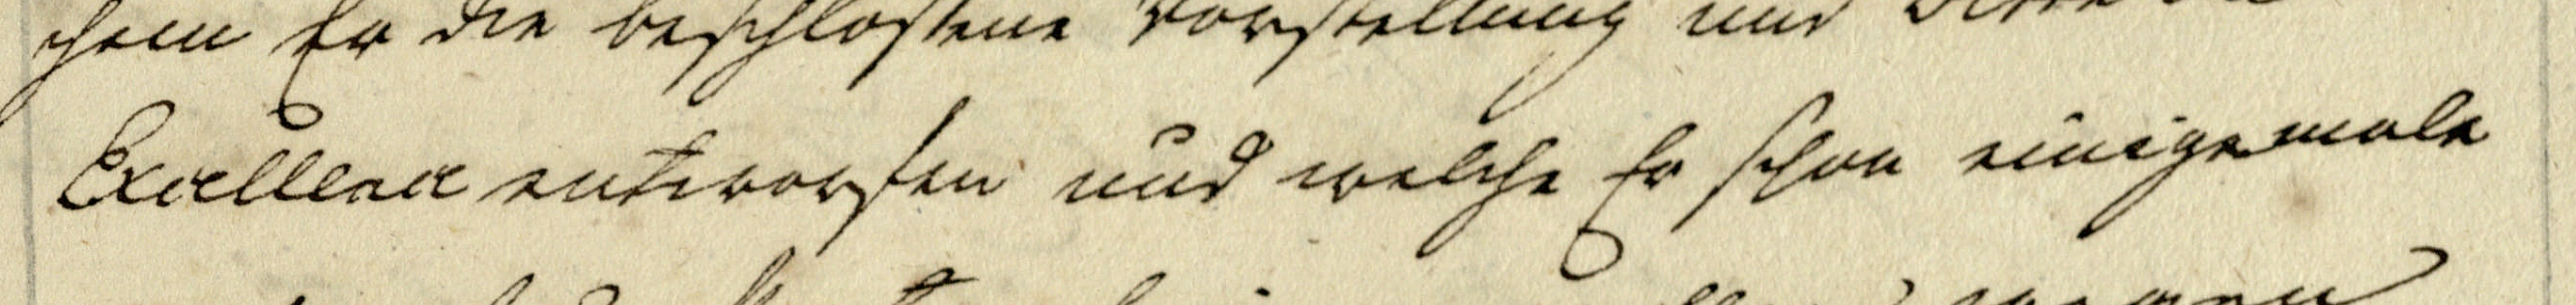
Excellence entworfen und welche Er schon einigemale
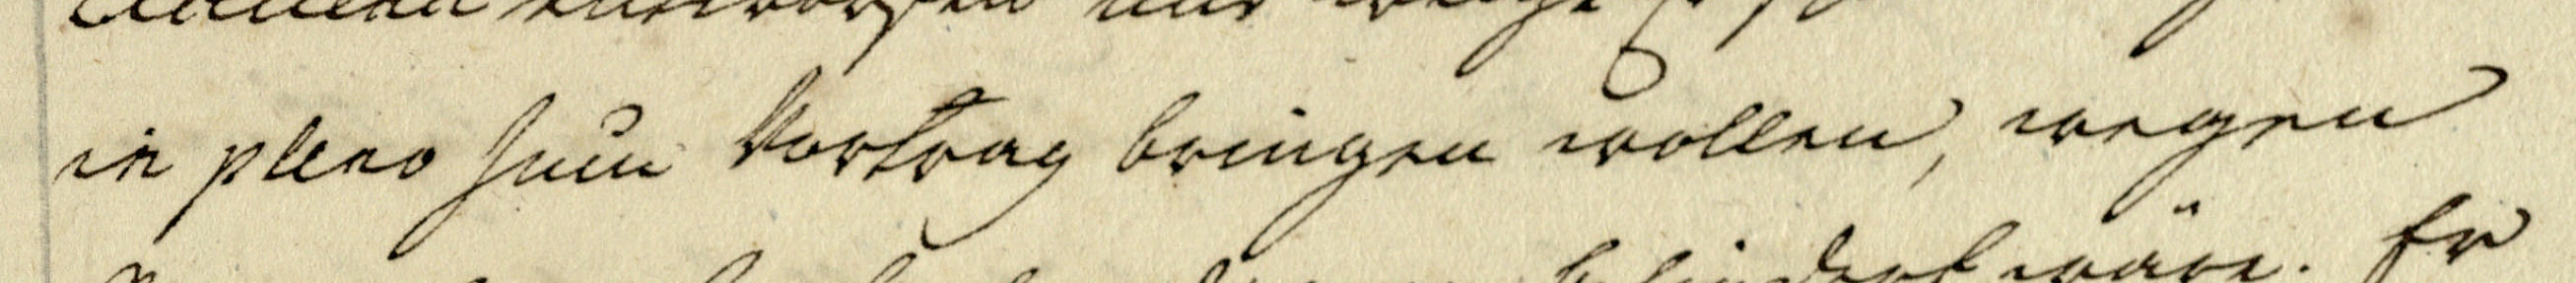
in pleno zum Vortrag bringen wollen, wegen
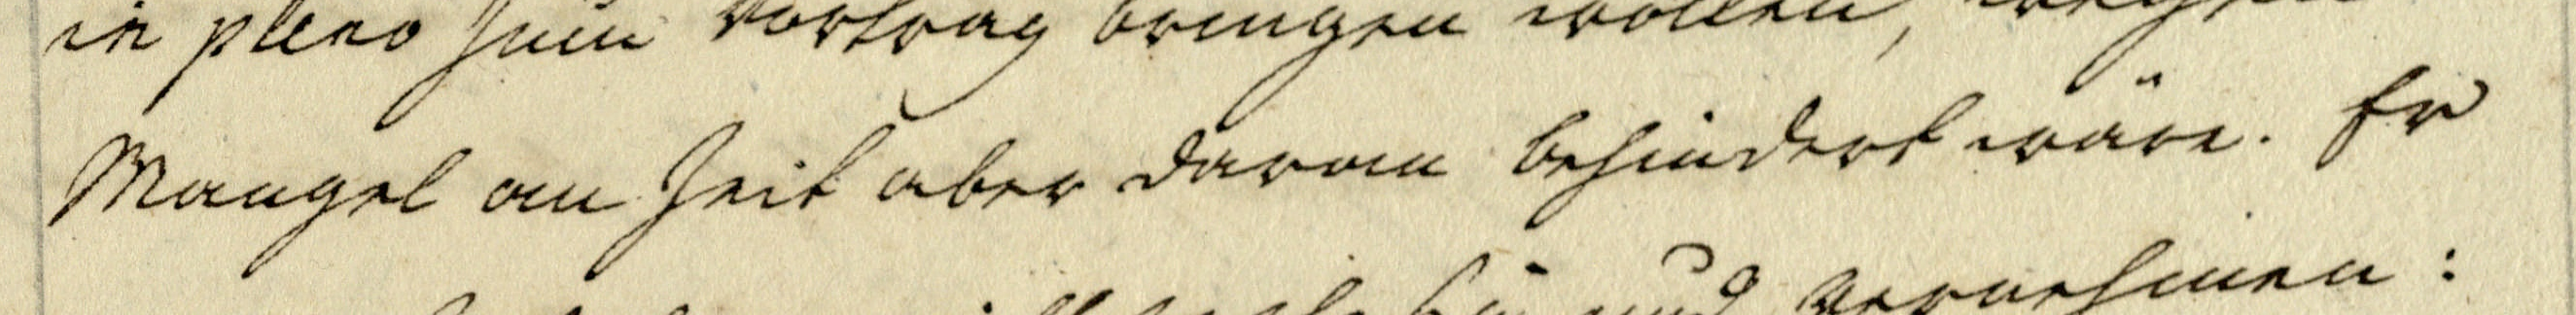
Mangel an Zeit aber daran behindert wäre. Er
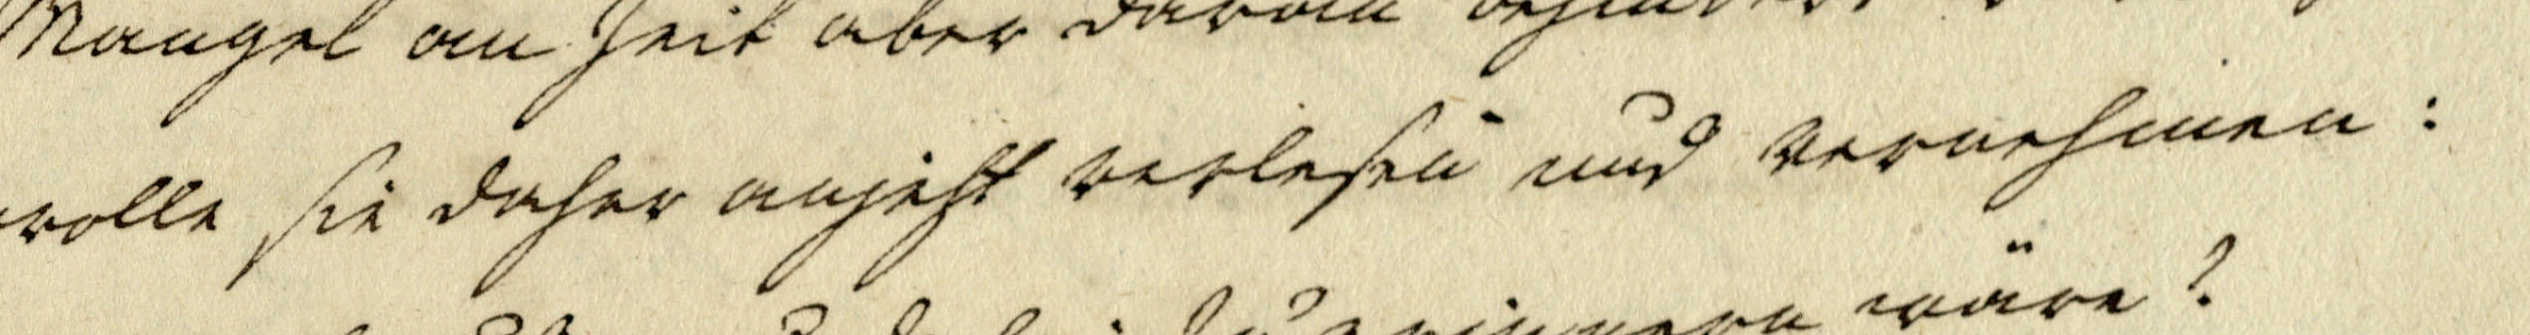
wolle sie daher anjetzt verlesen und vernehmen:
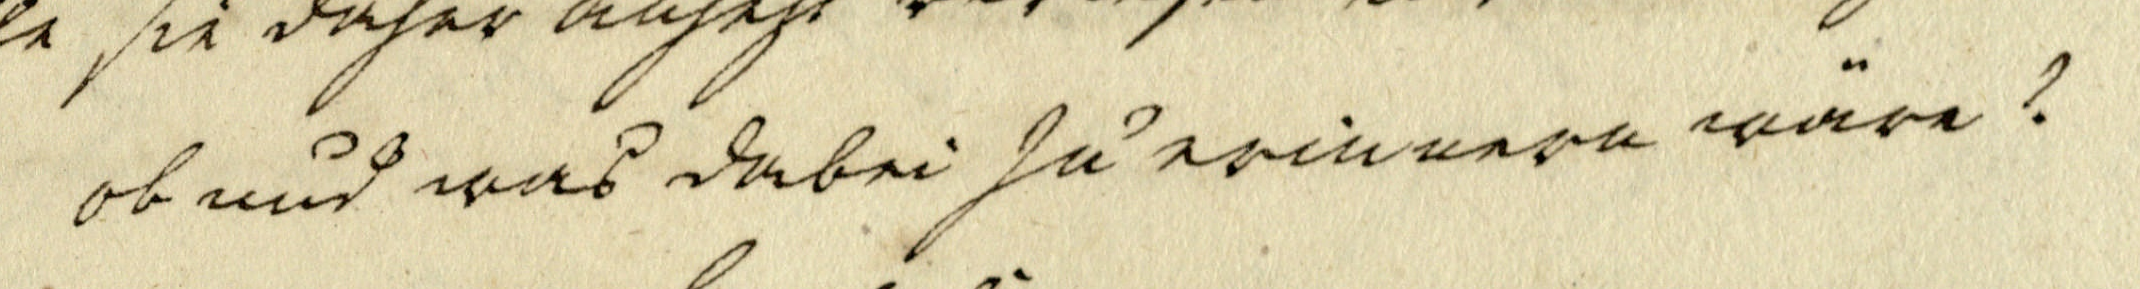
ob und was dabei zu erinnern wäre?
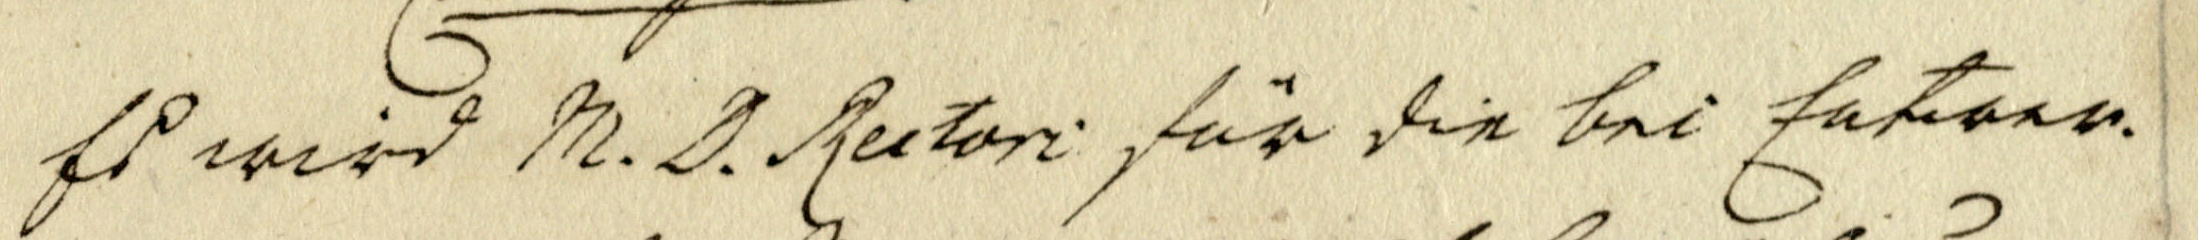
Es wird M. D. Rectori für die bei Entwer¬
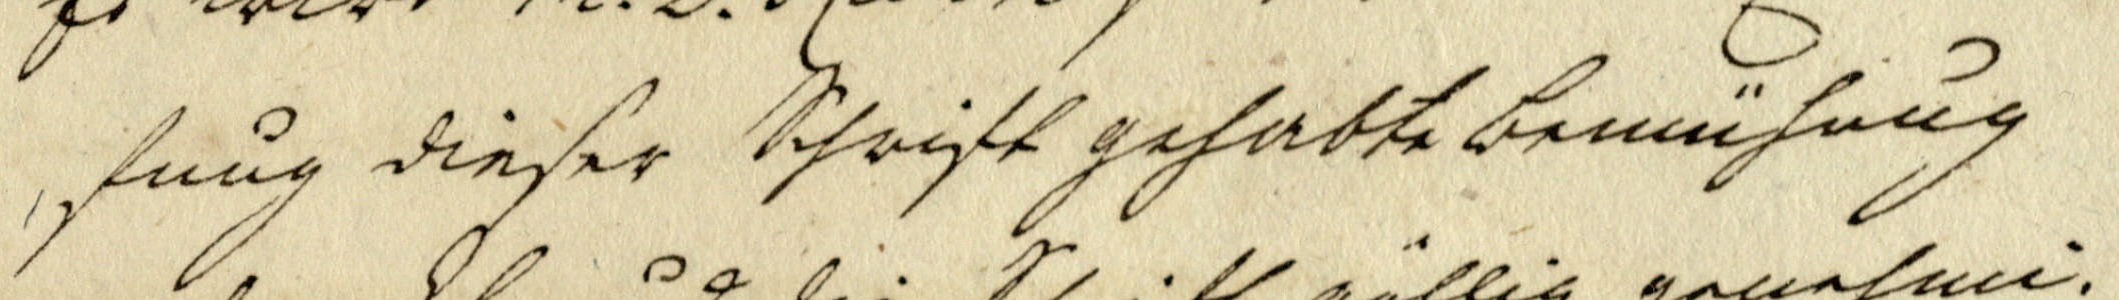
fung dieser Schrift gehabte Bemühung
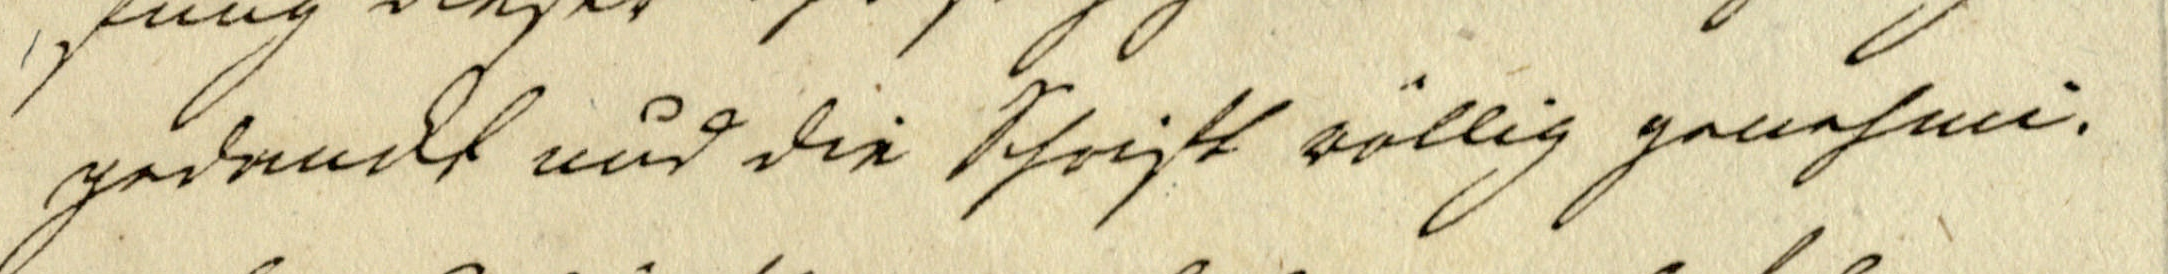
gedanckt und die Schrift völlig genehmi¬
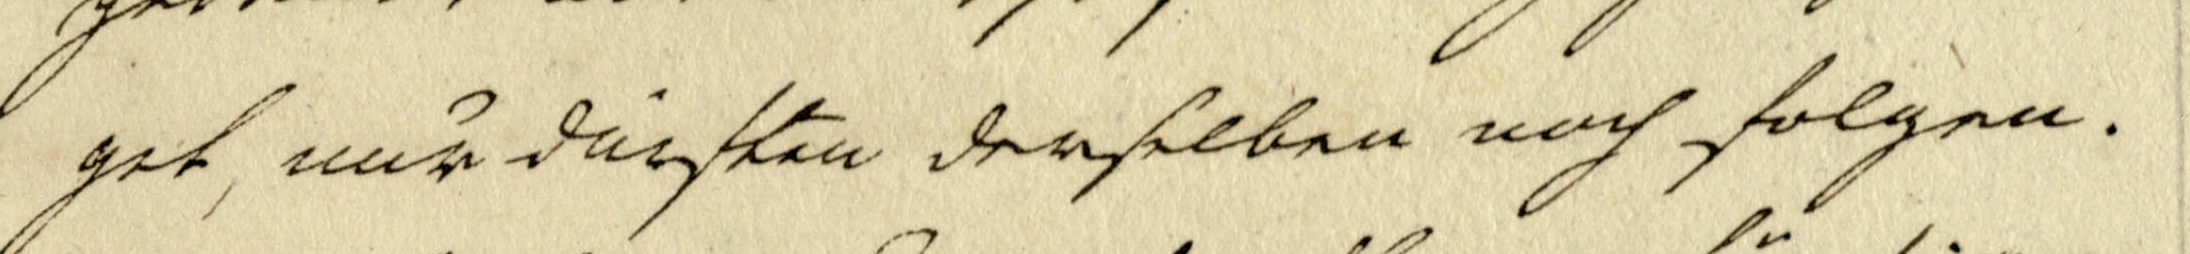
get, nur dürften derselben noch folgen¬
